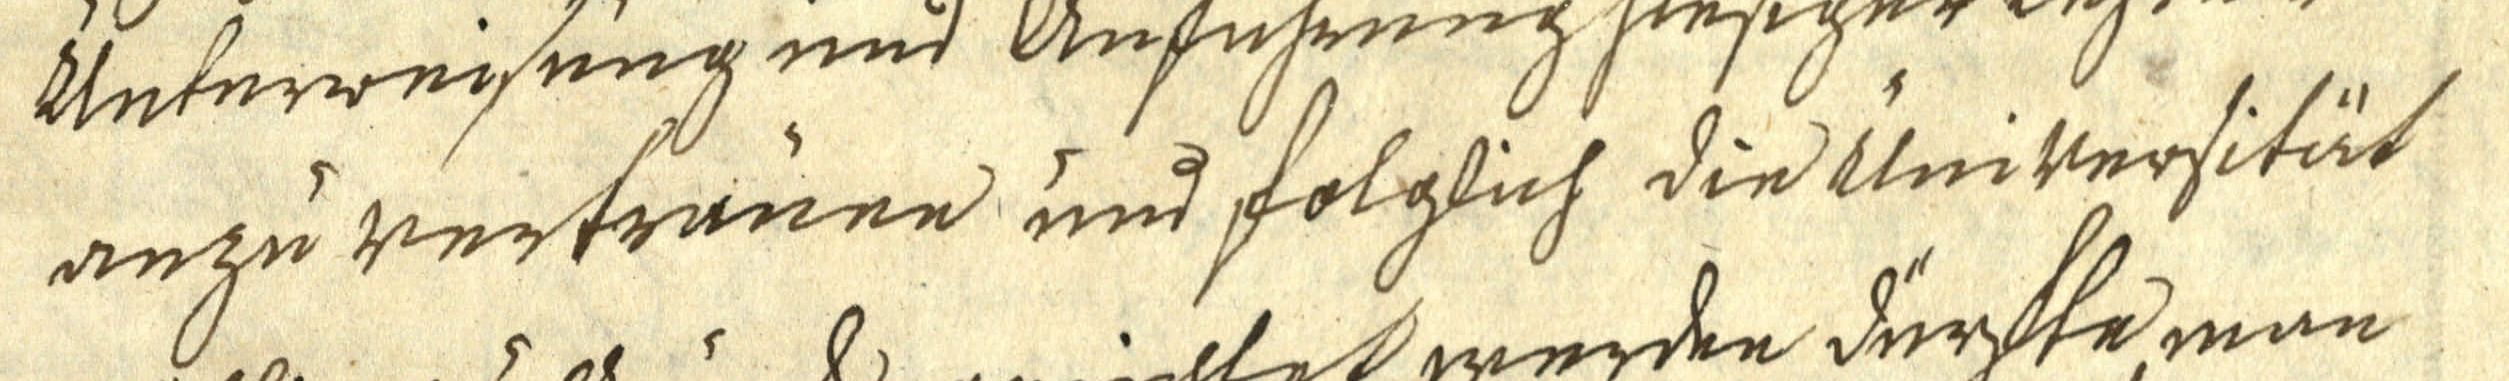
anzuvertrauen und folglich die Universität
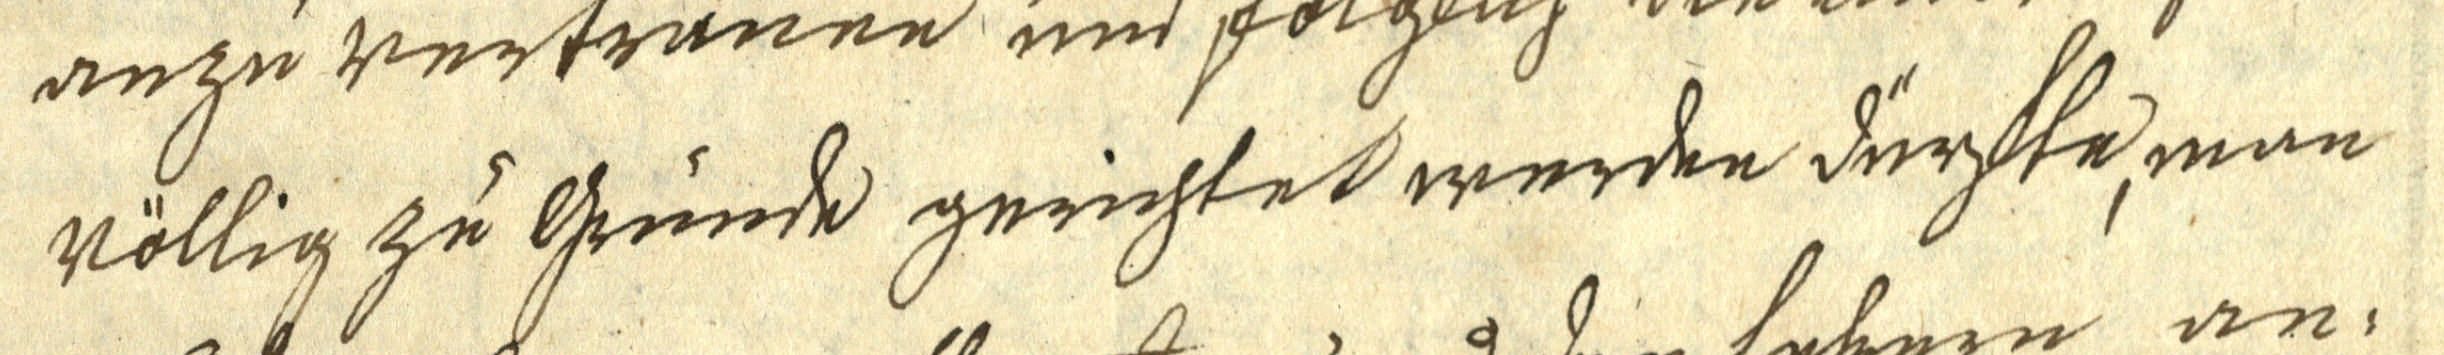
völlig zu Grunde gerichtet werden dürfte, man
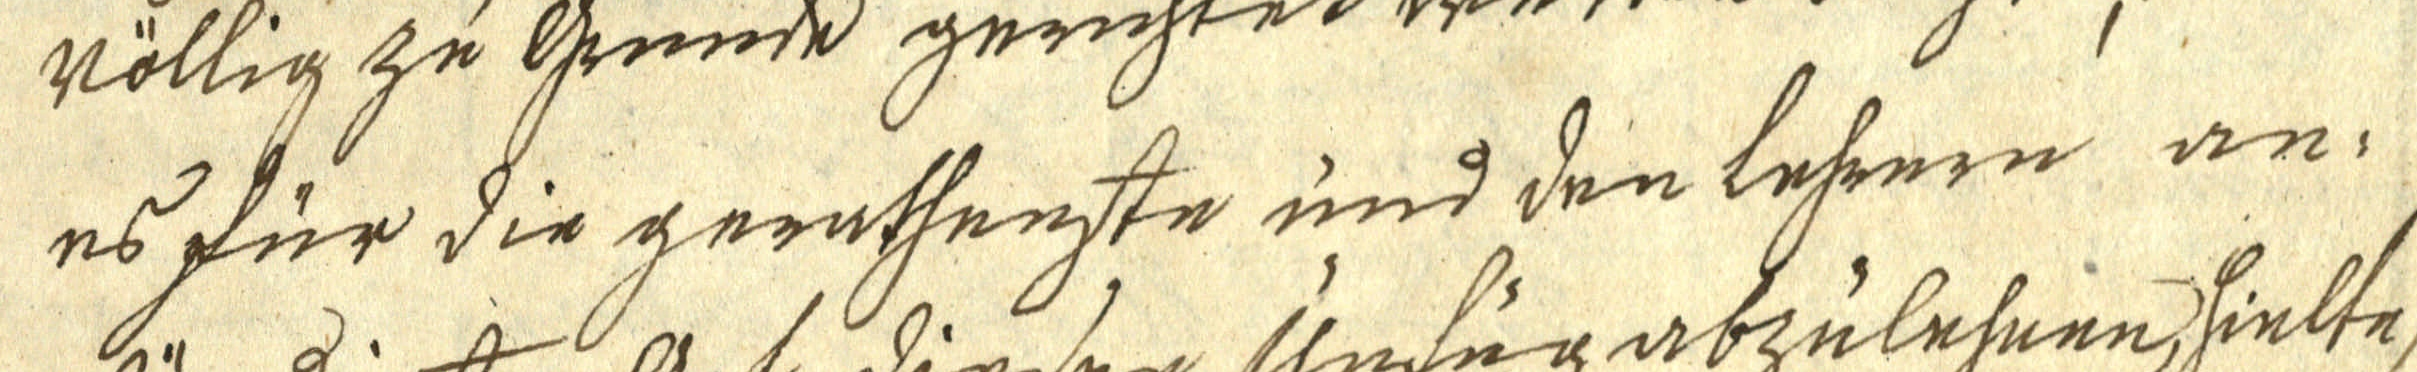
es für die gerathensten und den Lehrern an¬
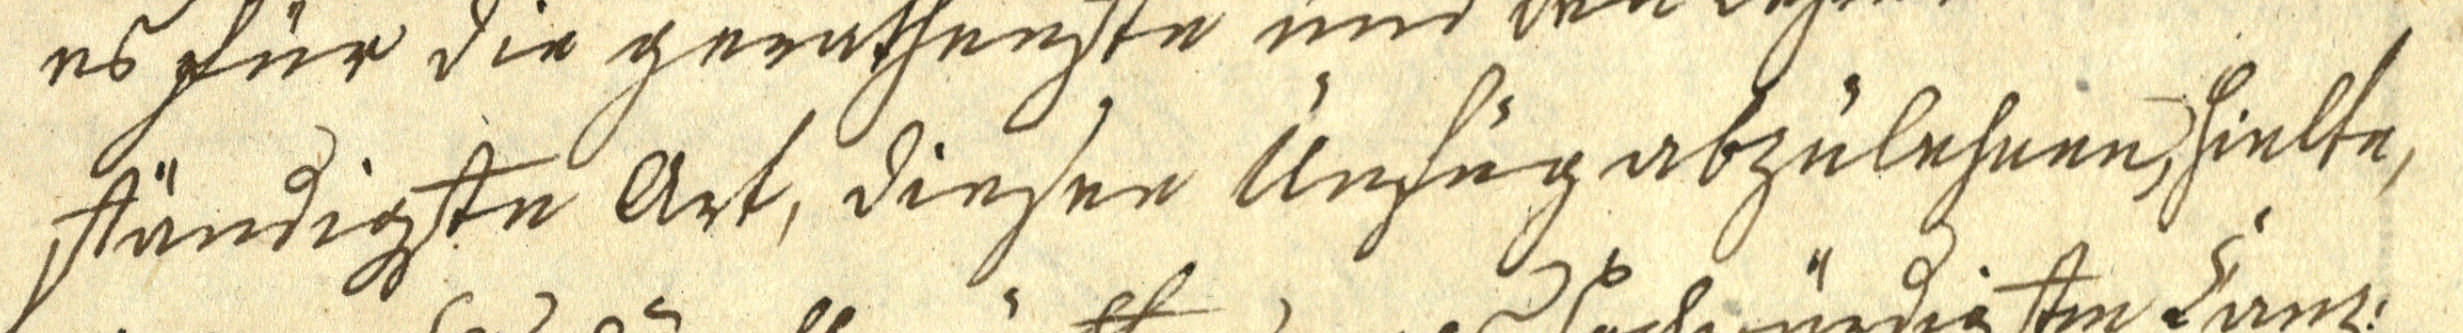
ständigste Art, diesen Unfug abzulehnen, hielte,
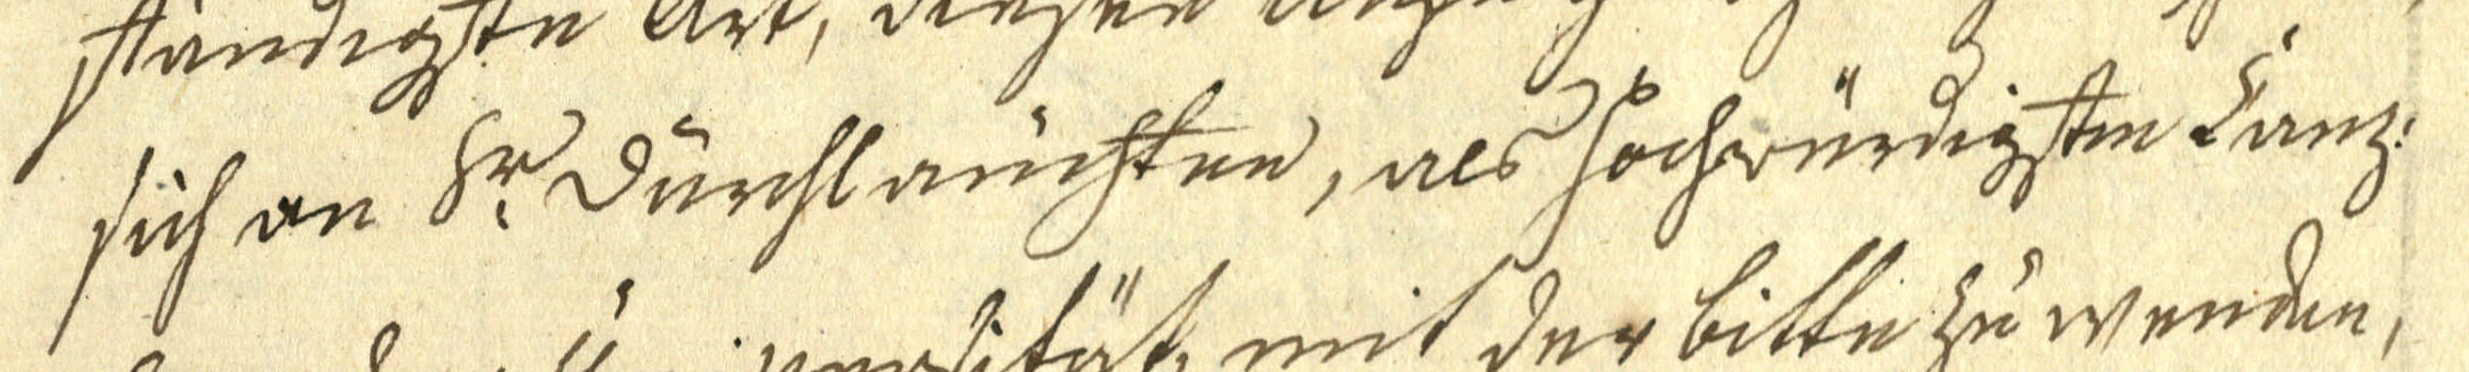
sich an Sr Durchlauchten, als hochwürdigsten Canz¬
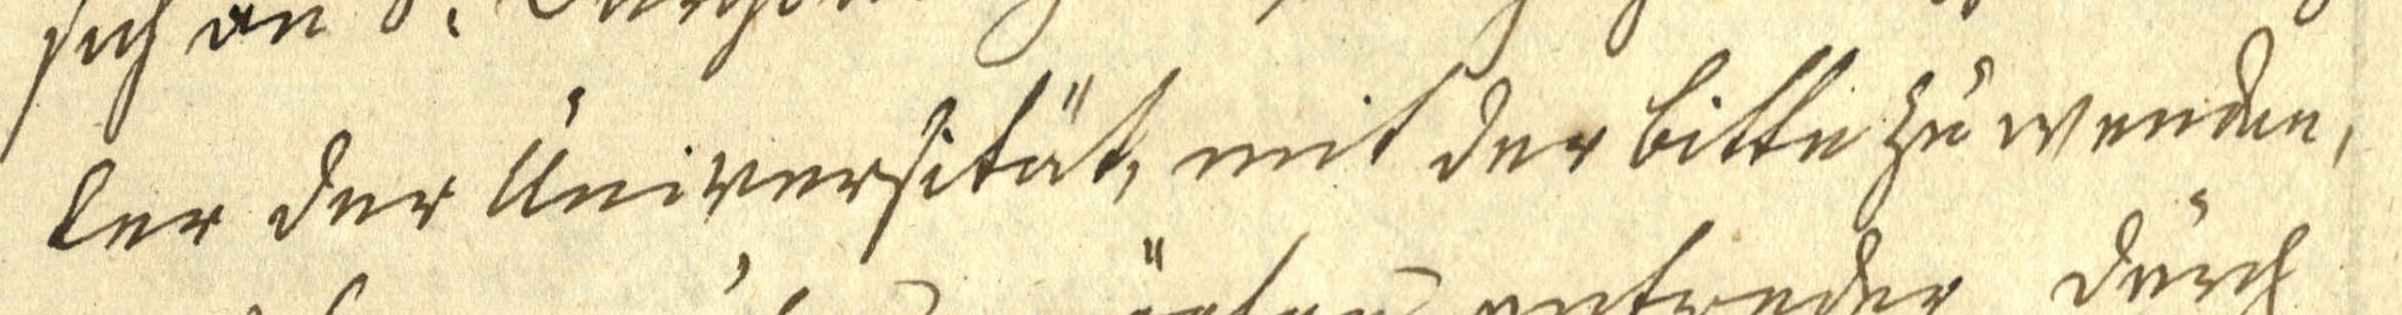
ler der Universität, mit der Bitte zu wenden,
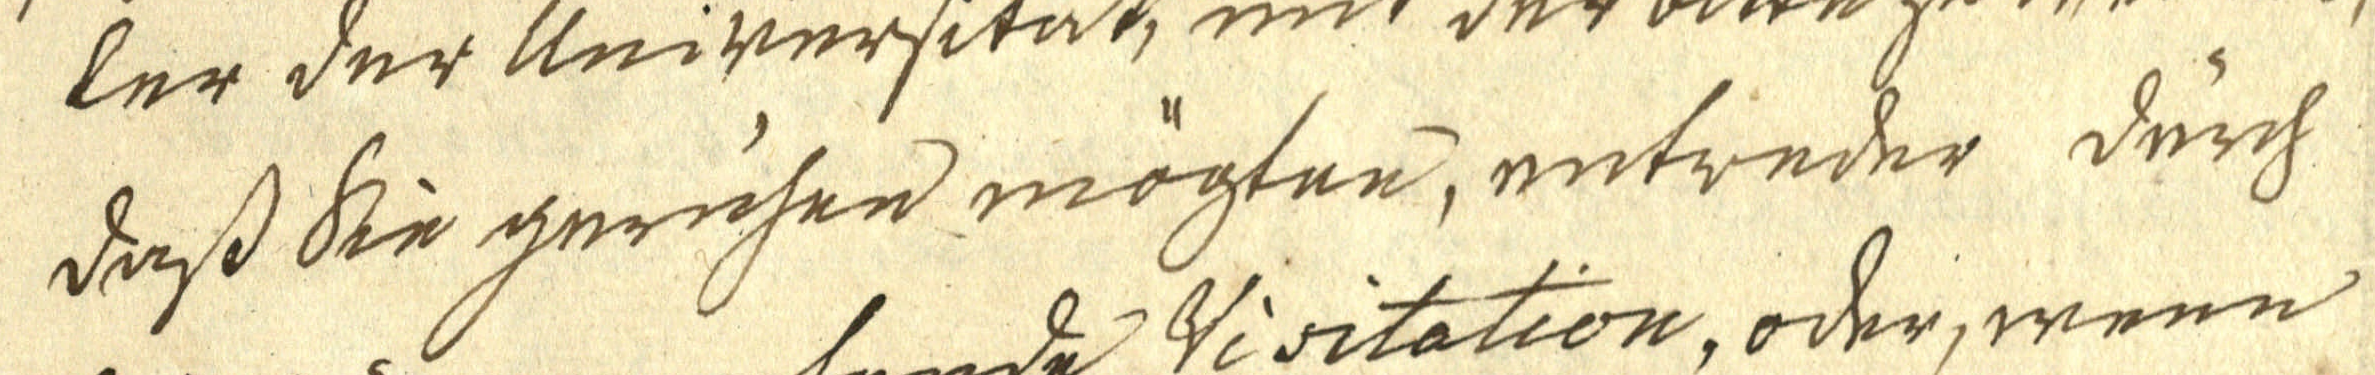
daß Sie geruhen mögten, entweder durch
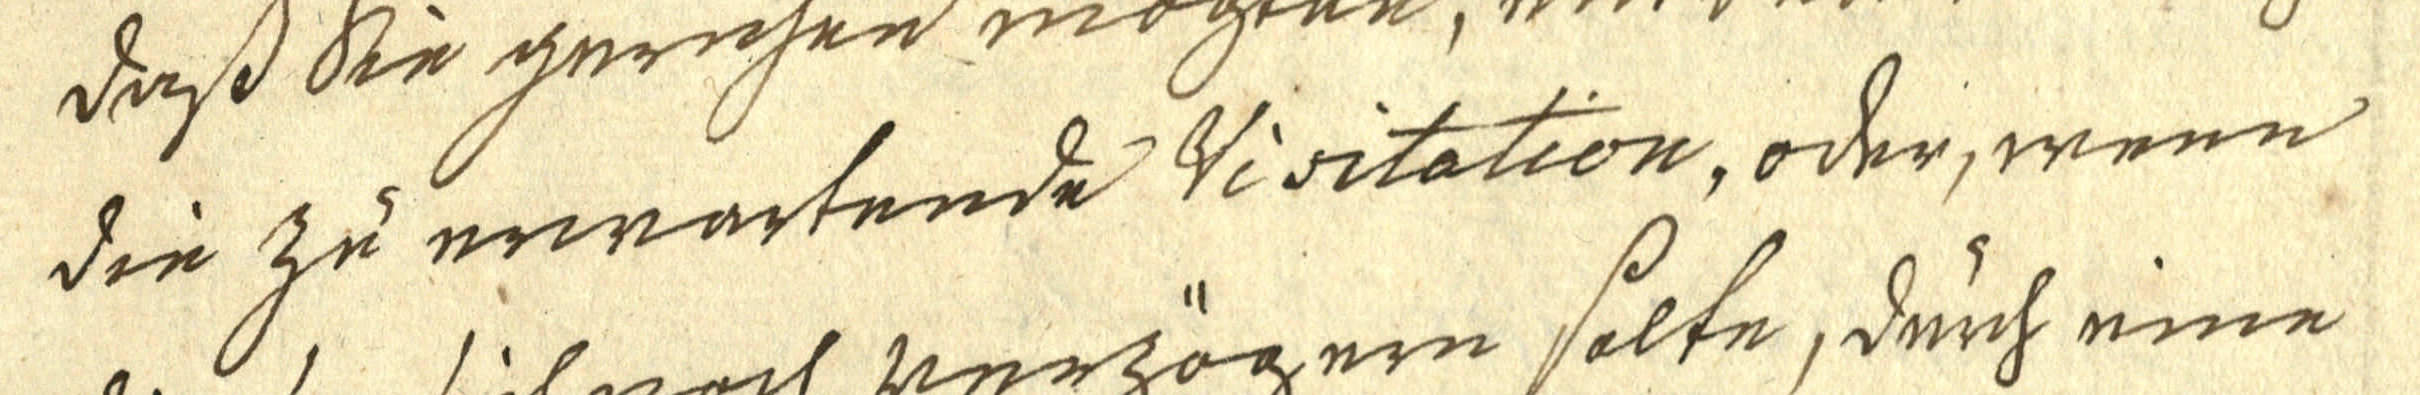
die zu erwartende Visitation, oder, wenn
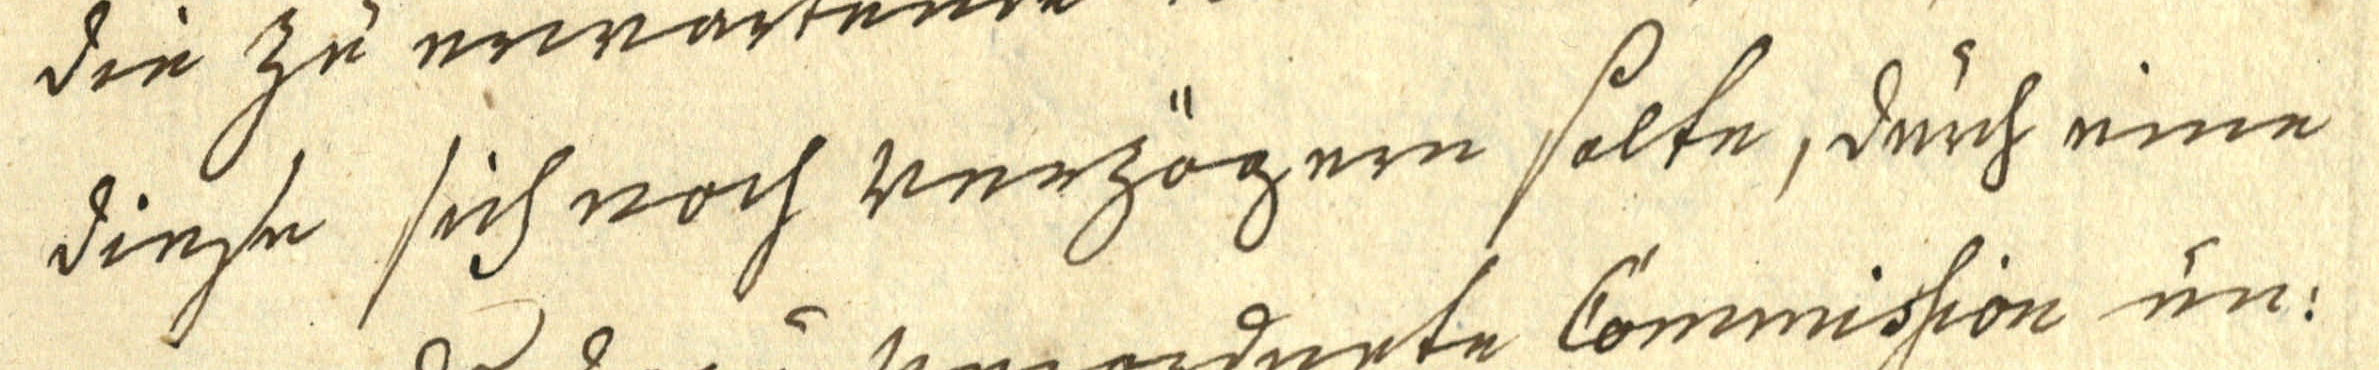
diese sich noch verzögern solte, durch eine
